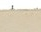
nun,
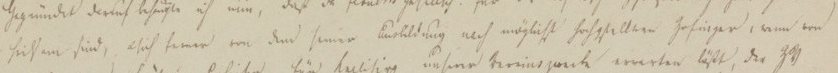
heilsam sind, & sich ferner von dem seiner Ausbildung nach möglichst hochgestellten Zofinger, wenn von
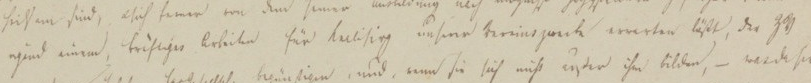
irgend einem, kräftiges Arbeiten für Realisirg unserer Vereinszwecke erwarten läßt, der ZV
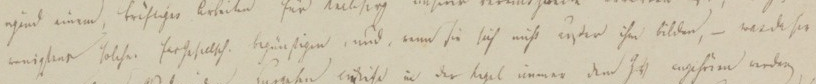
wenigstens solche FacGesellsch. begünstigen, und, wenn sie sich nicht außer ihm bilden, – was da sie
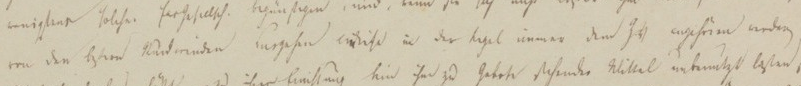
von den beßern Studirenden ausgehen und diese in der Regel immer dem ZV angehören werden,
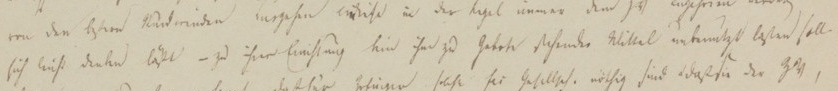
sich leicht denken läßt – zu ihrer Einrichtung kein ihm zu Gebote stehendes Mittel unbenutzt lassen soll.
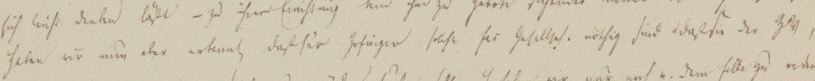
Haben wir nun aber erkannt, daß für Zofinger solche Fac.Gesellsch. nöthig sind & daß sie der ZV,
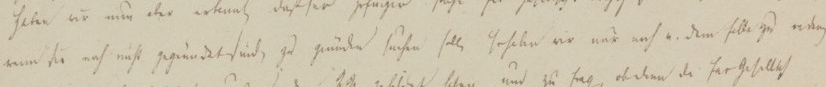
wenn sie noch nicht gegründet sind, zu gründen suchen soll, so haben wir nur noch v. dem Falle zu reden,
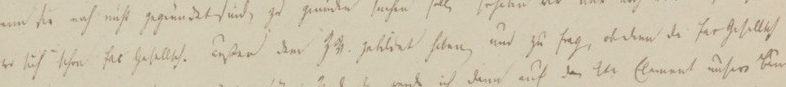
wo sich schon Fac.Gesellsch. außer dem ZV gebildet haben, und zu fragen, ob denn die Fac.Gesellsch.
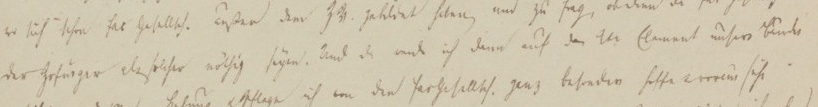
der Zofinger als solcher nöthig seyen. Und da werde ich dann auf das 2te Element unsers Bundes
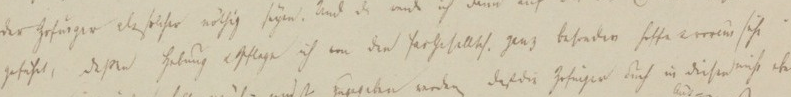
geführt, dessen Hebung & Pflege ich von den Fac.Gesellsch. ganz besonders hoffe & voraussehe.
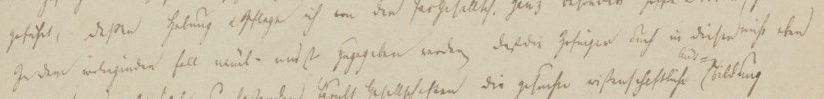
In dem vorliegenden Fall näml. muß zugegeben werden, daß die Zofinger auch in diesen nicht eben
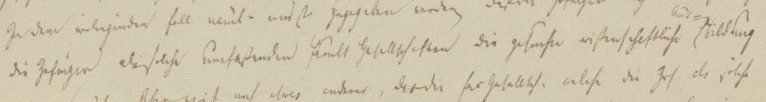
die Zofinger als solche umfassenden FacultGesellschaften die gesuchte wissenschaftliche Ausbildung
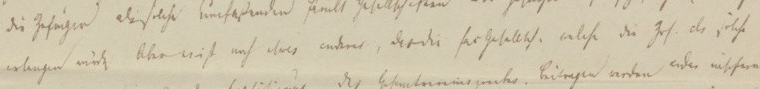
erlangen würden. Aber es ist noch etwas anderes, das die FacGesellsch. welche die Zof. als solche
